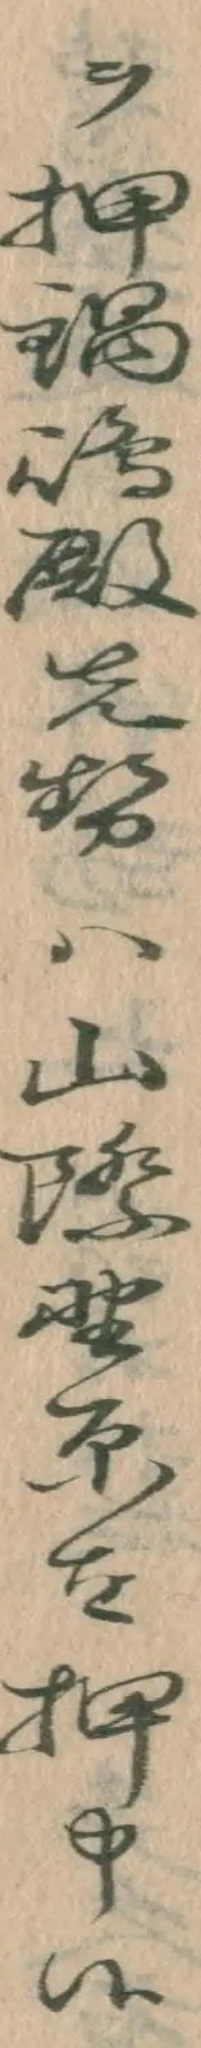を押鍋島殿先勢は山際野原を押申候
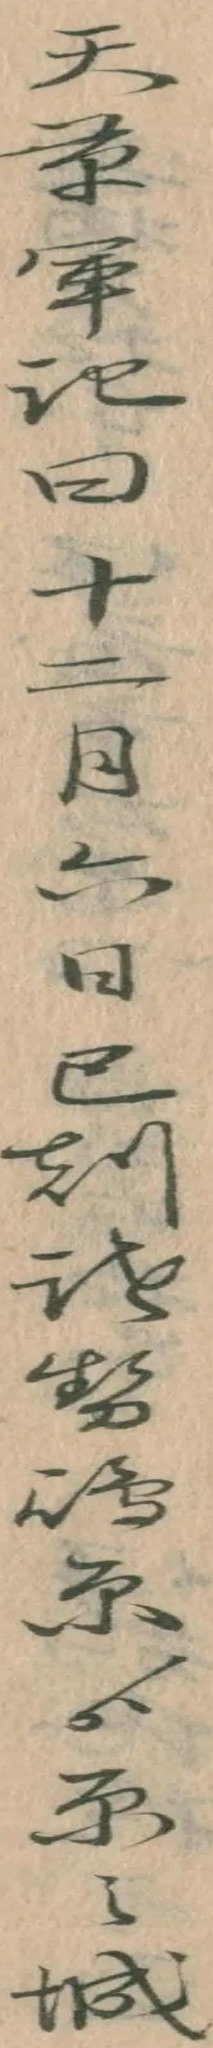天草軍記曰十二月六日巳刻諸勢島原ゟ原之城
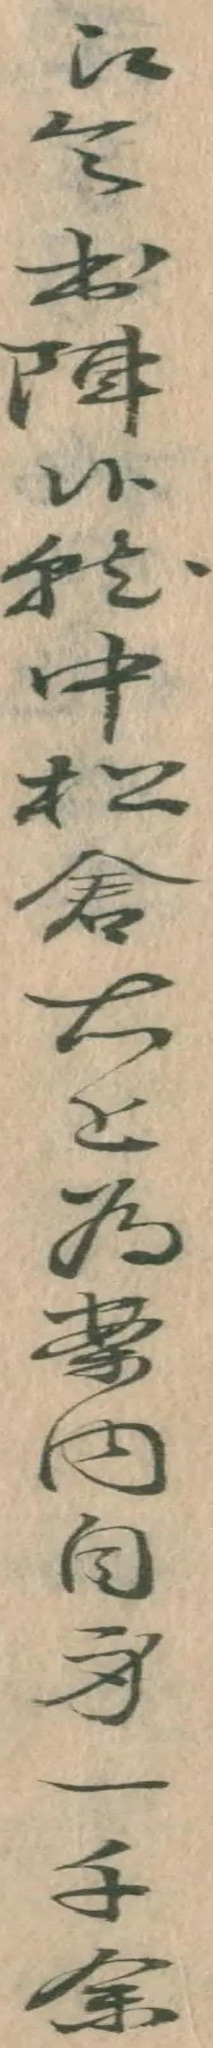江令出陣候就中松倉右近為案内自身一千余
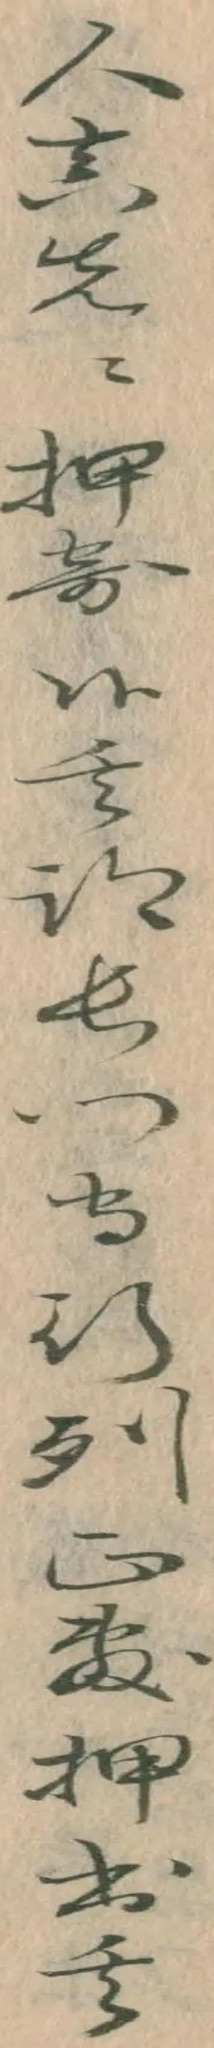人真先に押寄候其跡長門守行列正敷押出其
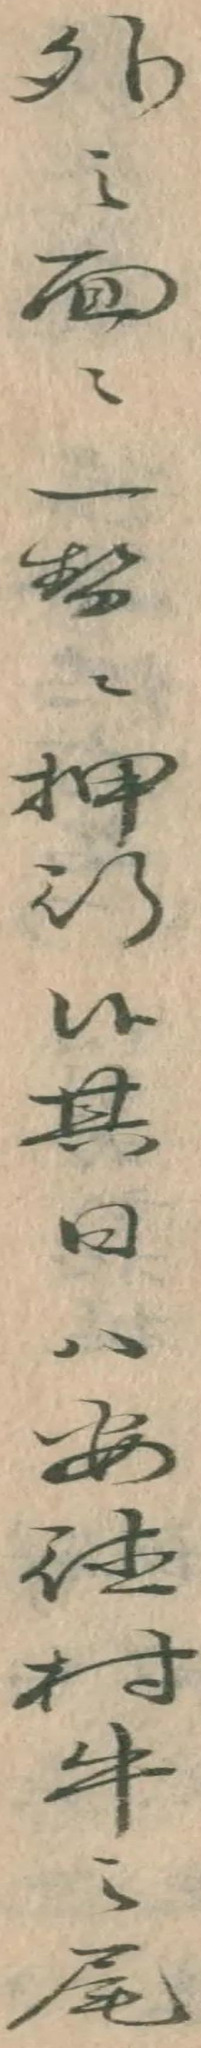外之面々一勢に押行候其日は安徳村牛之尾
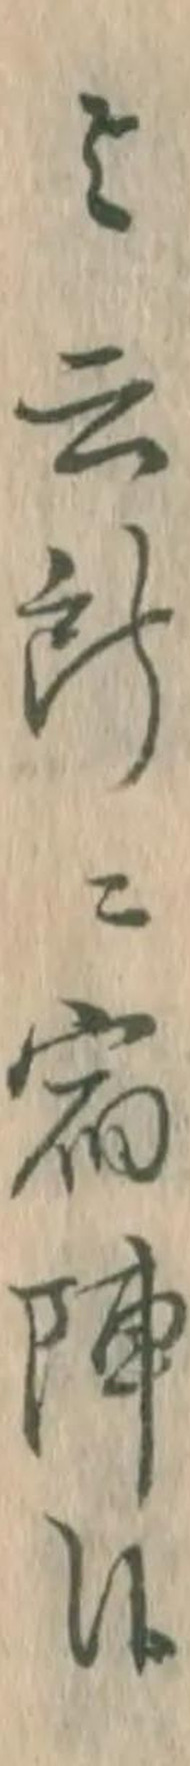と云所に宿陣候
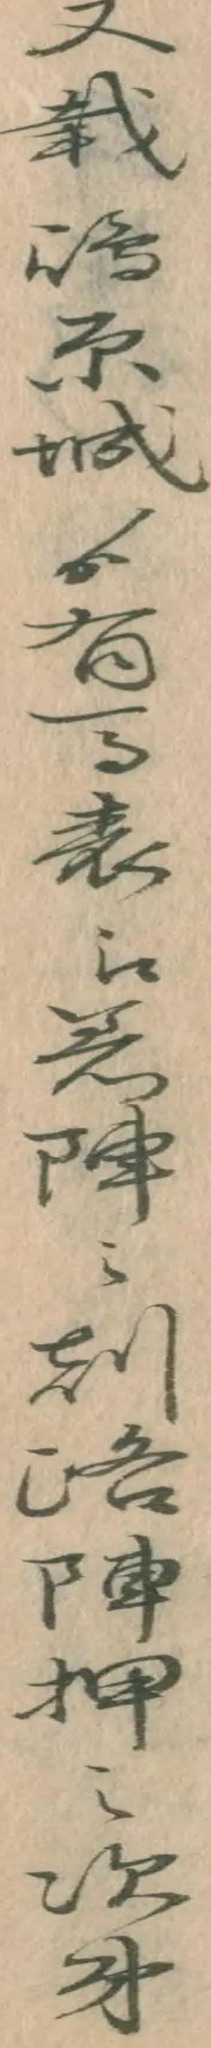又載島原城ゟ有馬表江着陣之刻路陣押之次第

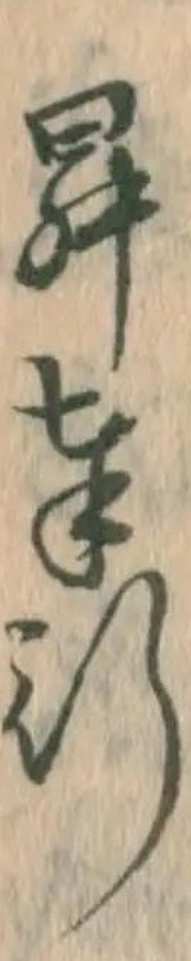昇奉行
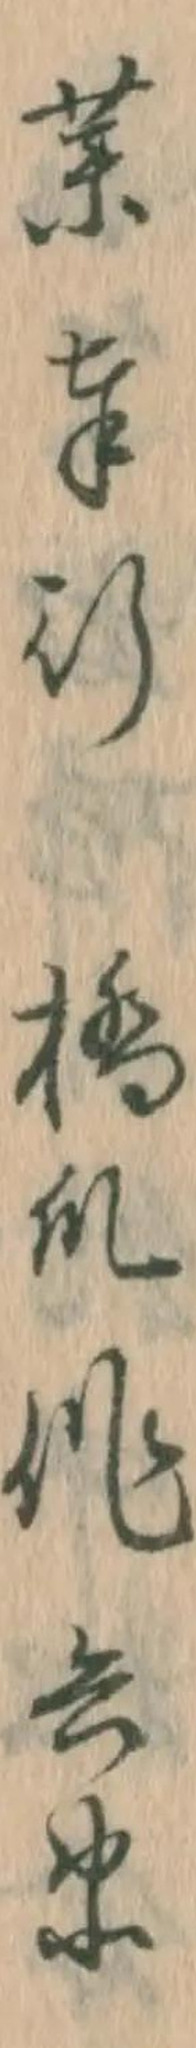薬奉行橋爪作兵衛
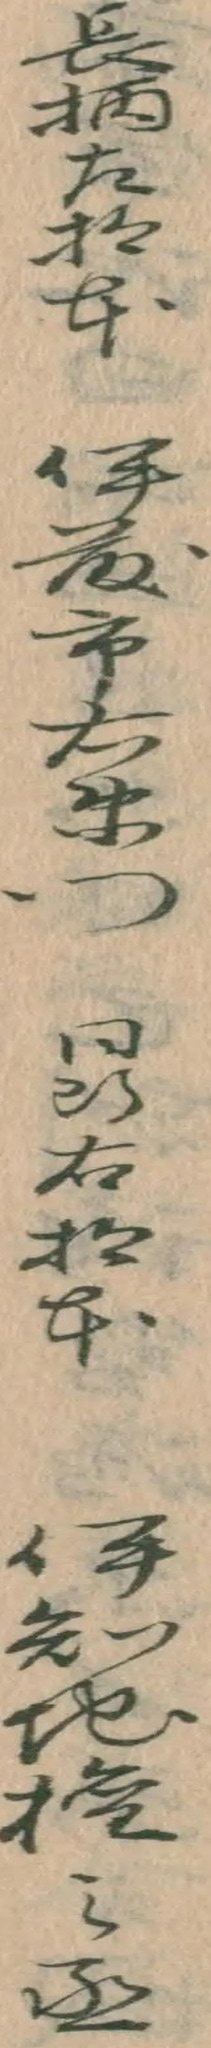長柄左拾本伊藤市右衛門同断右拾本伊知地権之丞
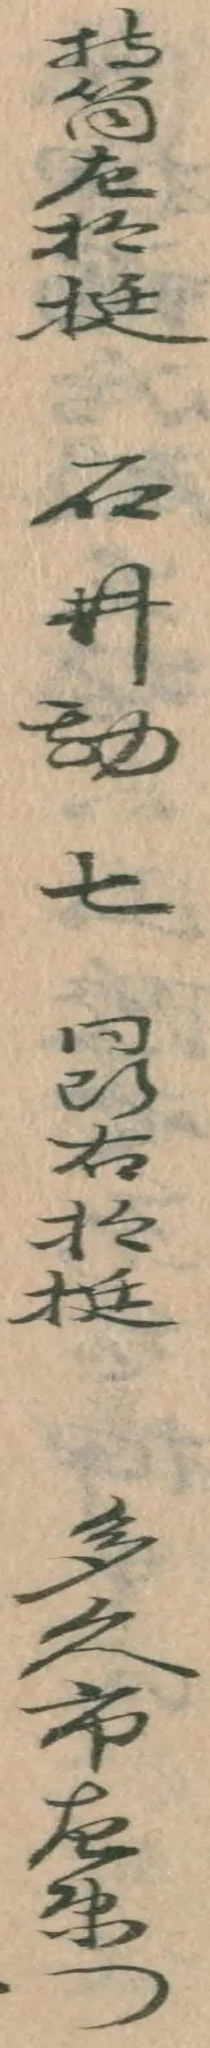持筒左拾挺石井勘七同断右拾挺多久市左衛門
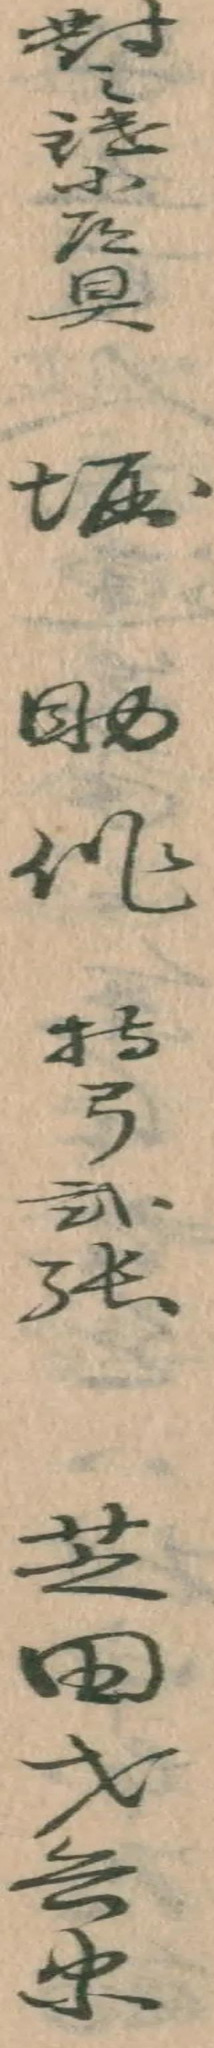対之鑓小道具掘助作持弓弐張芝田才兵衛
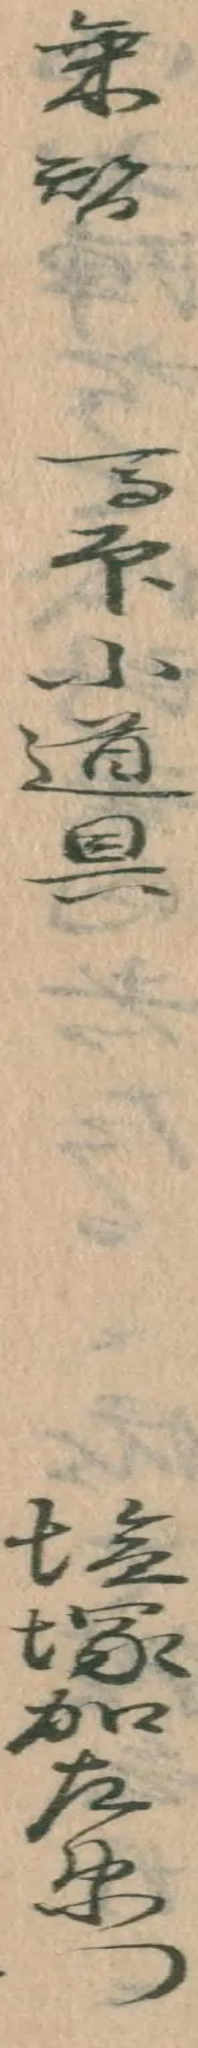乗替馬印小道具塩塚加左衛門
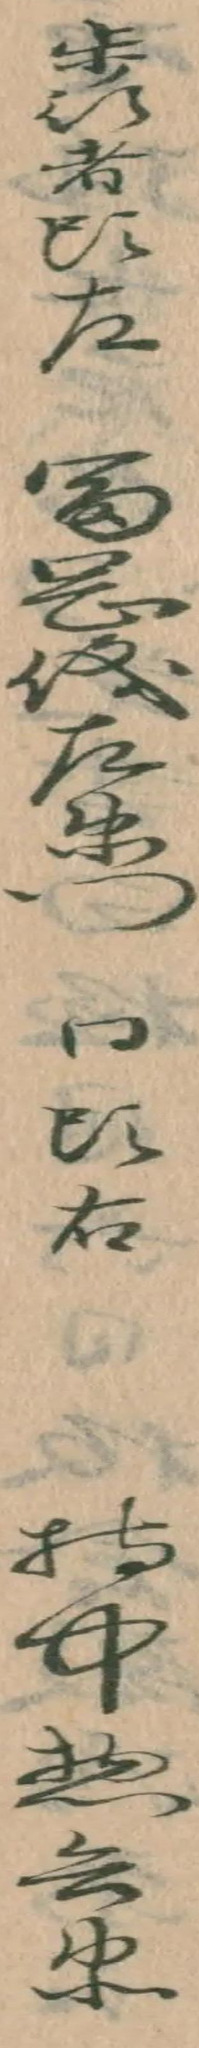歩行者頭左富岡儀左衛門同頭右持中惣兵衛
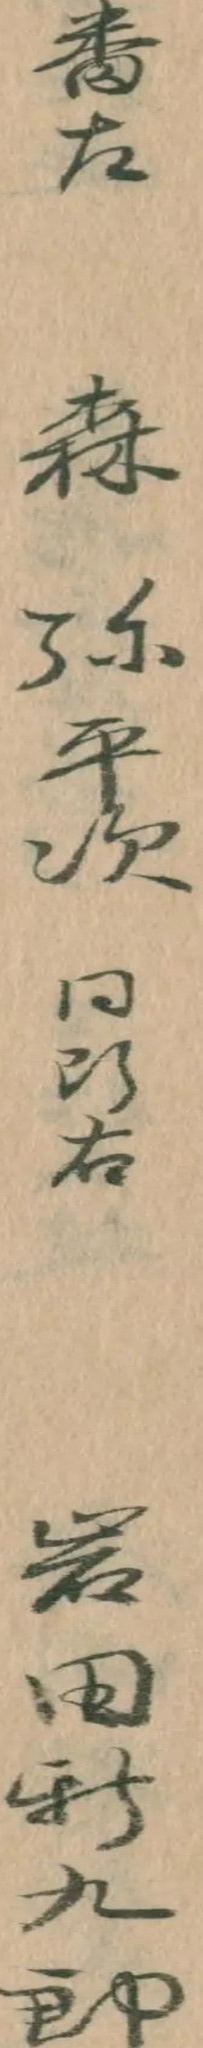使番左森弥平次同断右岩田新九郎
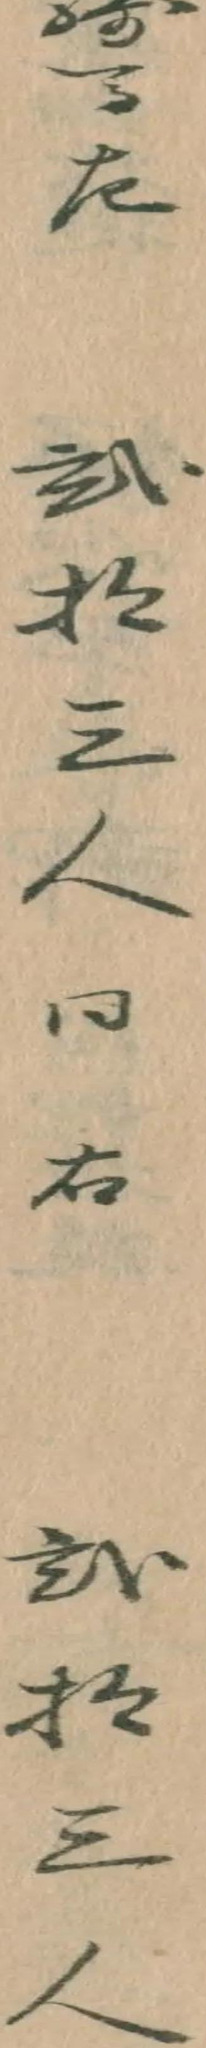騎馬左弐拾三人同右弐拾三人
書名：切支丹御退治記 49巻. [3]
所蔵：国立国会図書館 National Diet Library, JAPAN
